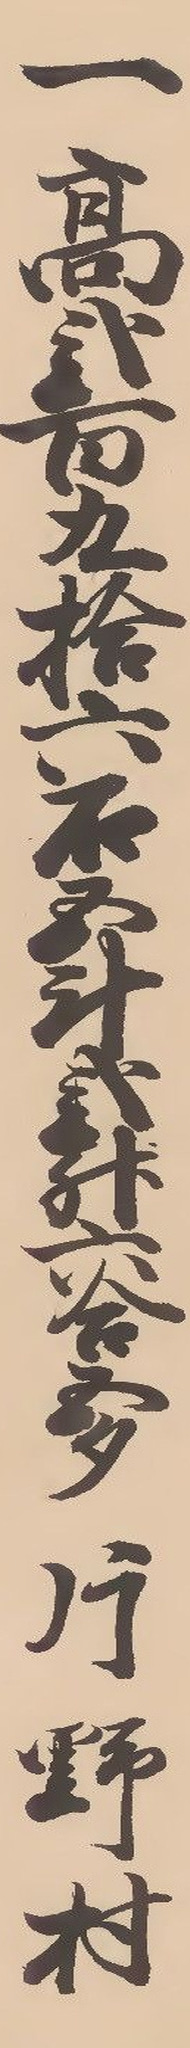一高弐百九拾六石五斗弐升六合五勺片野村
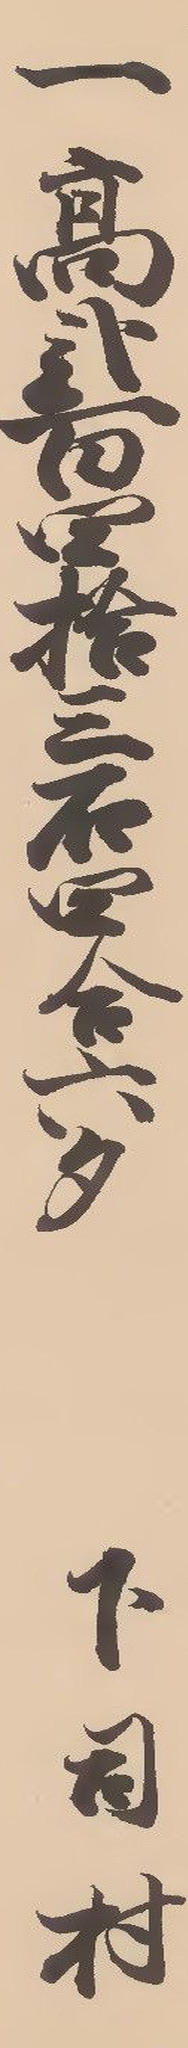一高弐百四拾三石四合六勺下司村
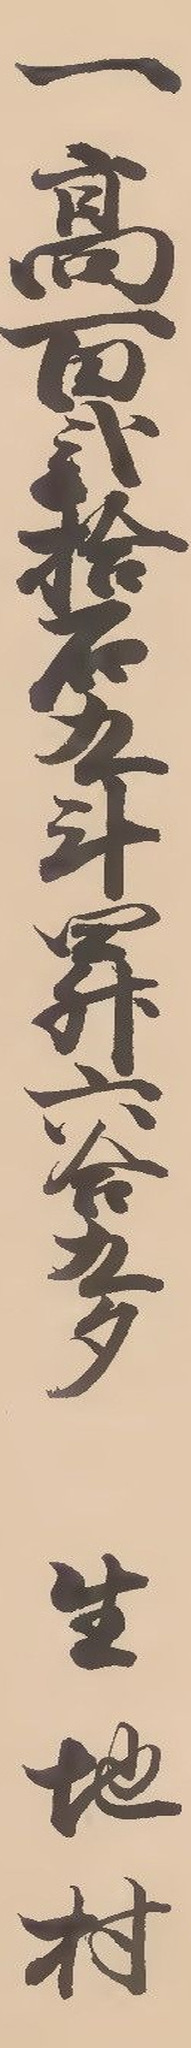一高百弐拾石九斗四升六合九勺生地村
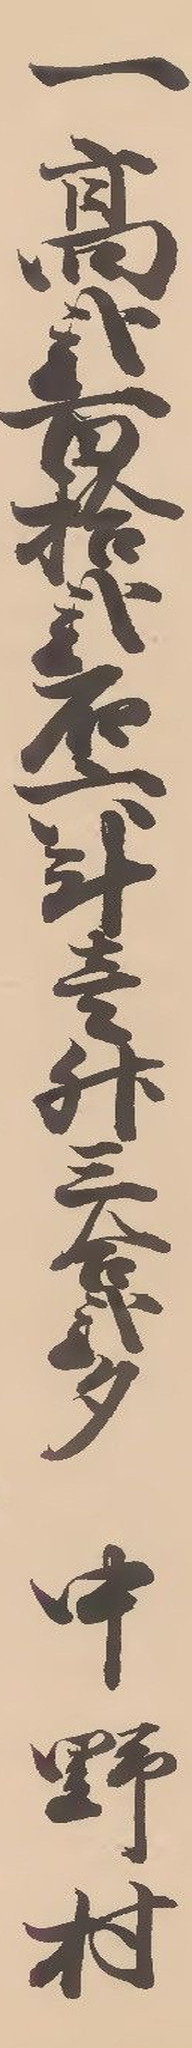一高弐百拾弐石六斗壱升三合弐勺中野村
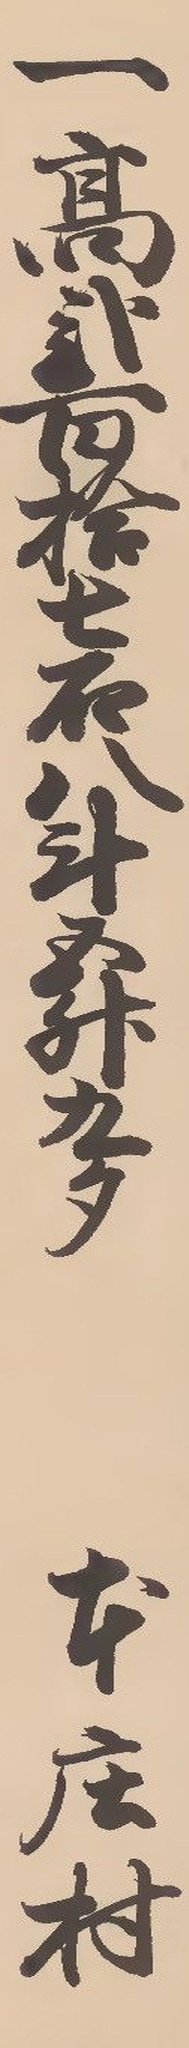一高弐百拾七石八斗五升九勺本庄村
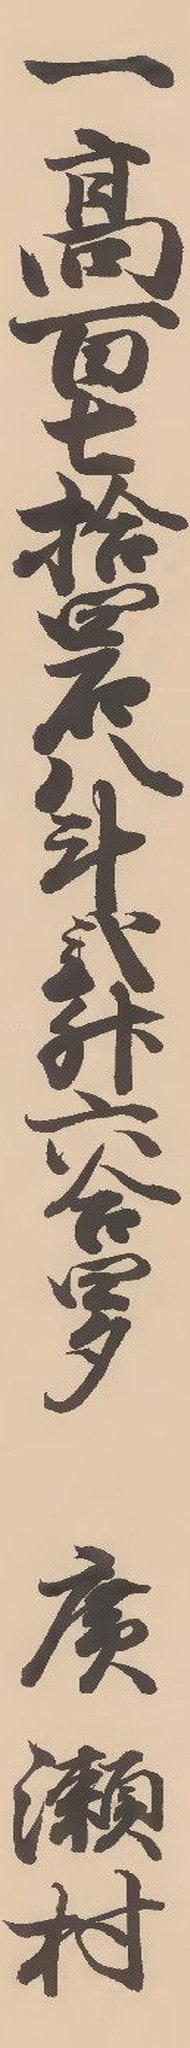一高百七拾四石八斗弐升六合四勺広瀬村
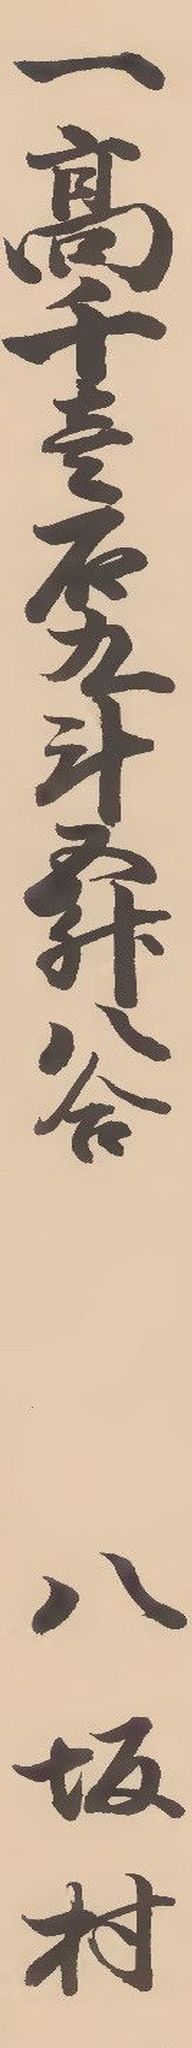一高千壱石九斗五升八合八坂村
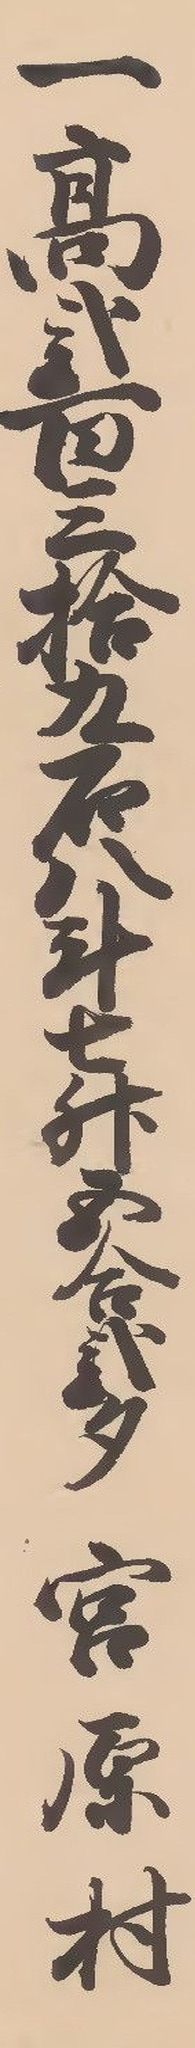一高弐百三拾九石八斗七升五合弐勺宮原村

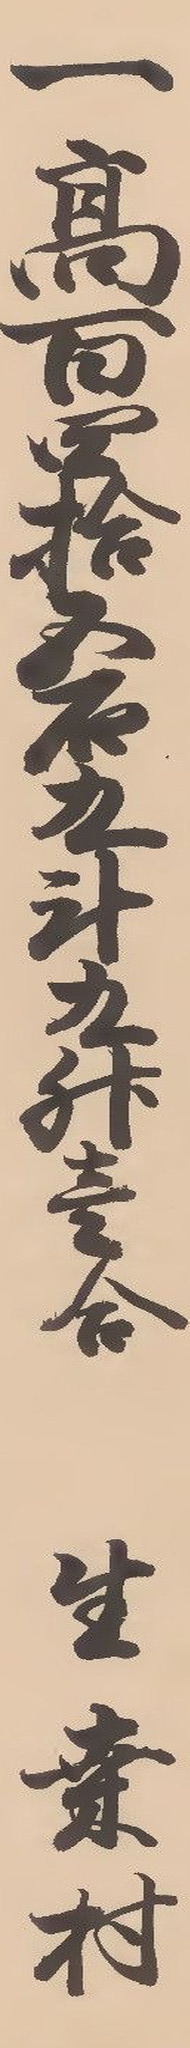一高百四拾五石九斗九升壱合生桑村
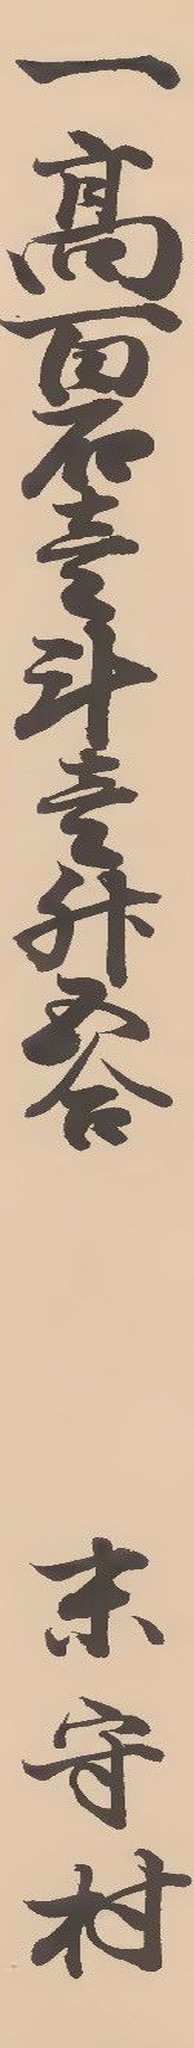一高百石壱斗壱升五合末守村
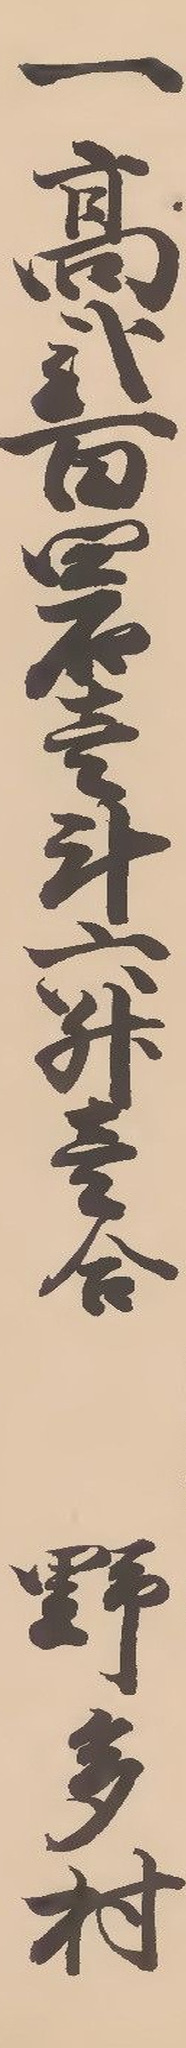一高弐百壱石三斗六升六合中村
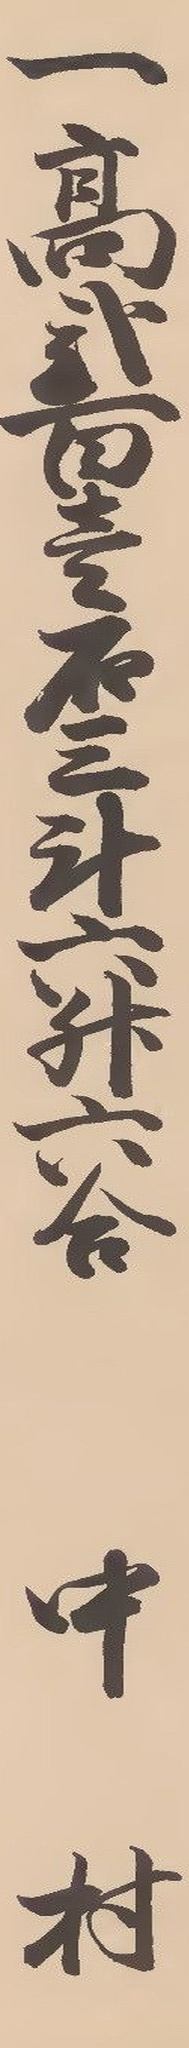一高弐百壱石三斗六升六合中村
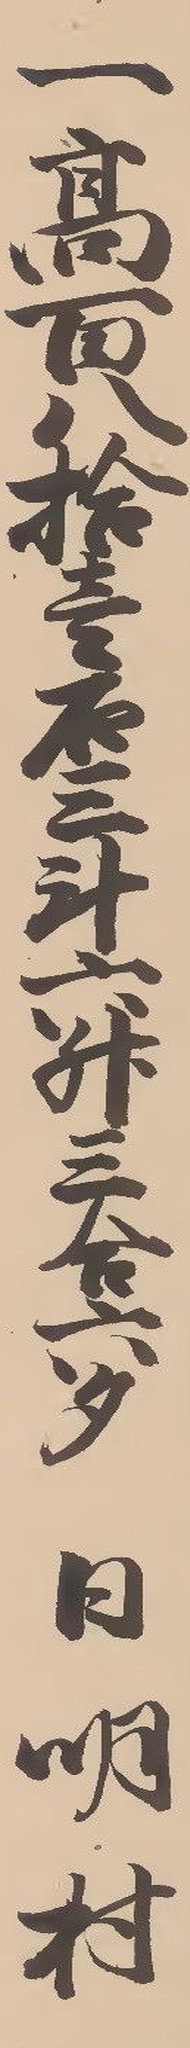一高百八拾壱石三斗六升三合六勺日明村
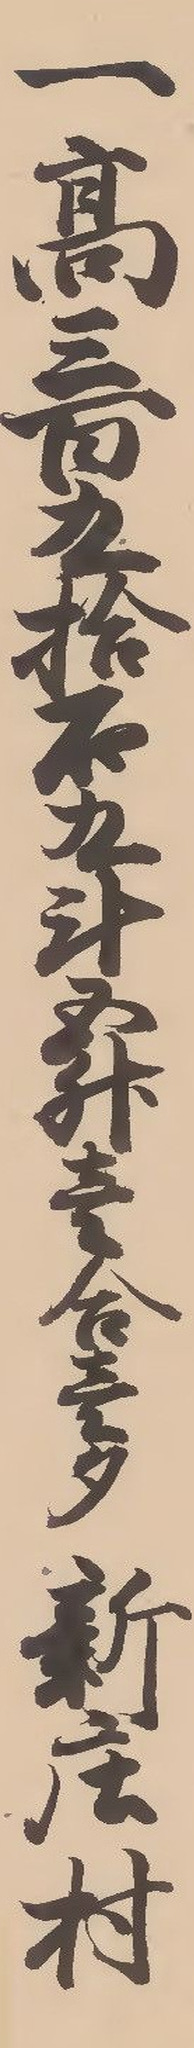一高三百九拾石九斗五升壱合壱勺新庄村
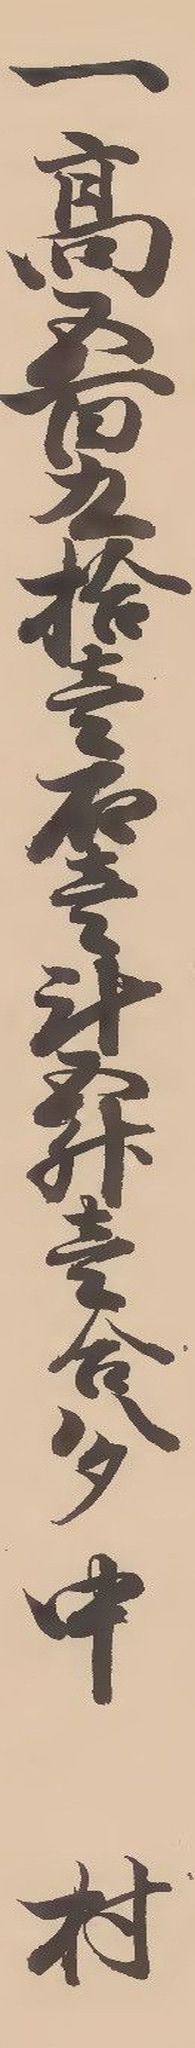一高五百九拾壱石壱斗五升壱合八勺中村
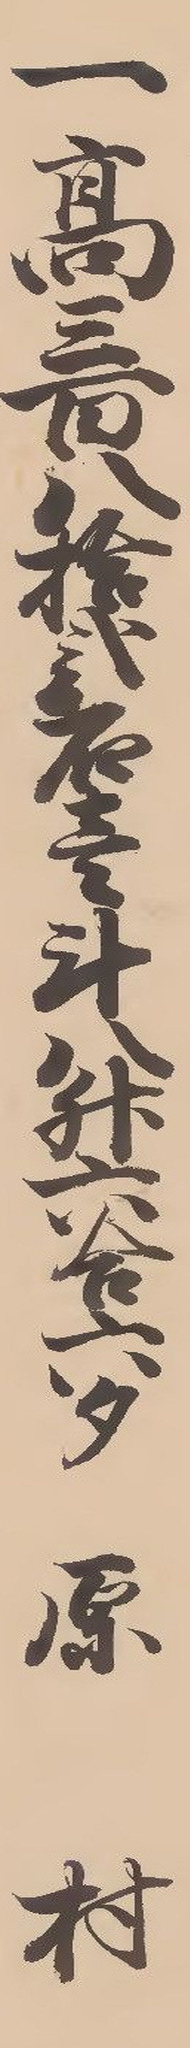一高三百八拾弐石壱斗八升六合六勺原村
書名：豊後国郷帳
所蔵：国立公文書館 National Archives of Japan
